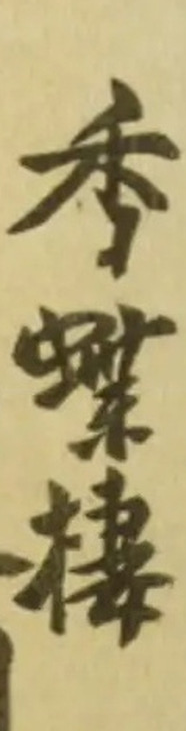香蝶楼
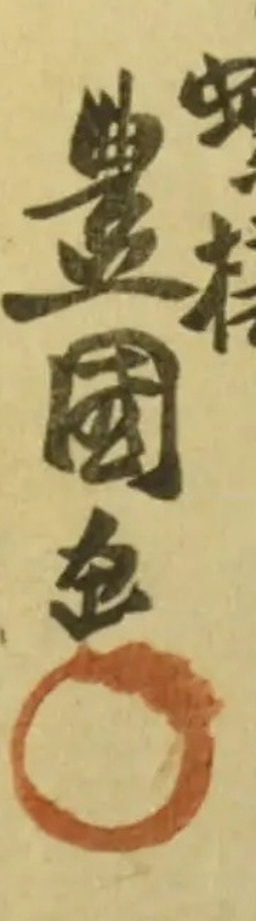豊国画
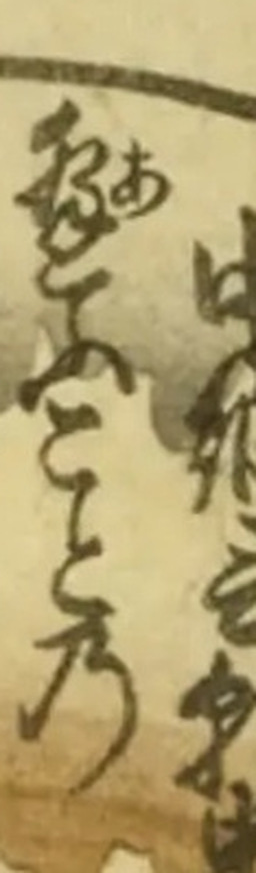逢ふことの
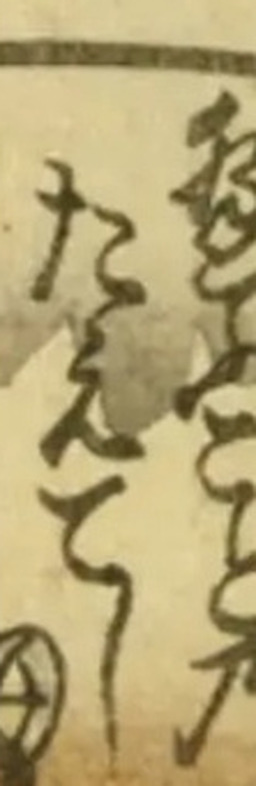たえてし
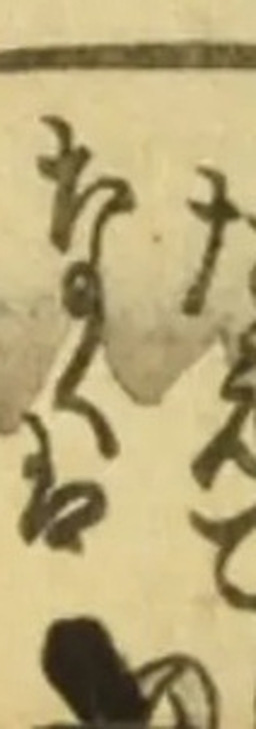なくは
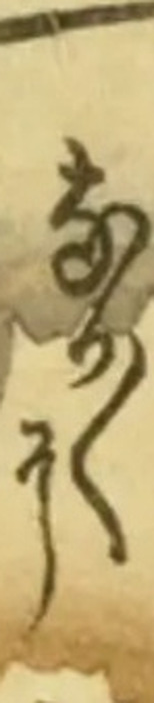なか〳〵
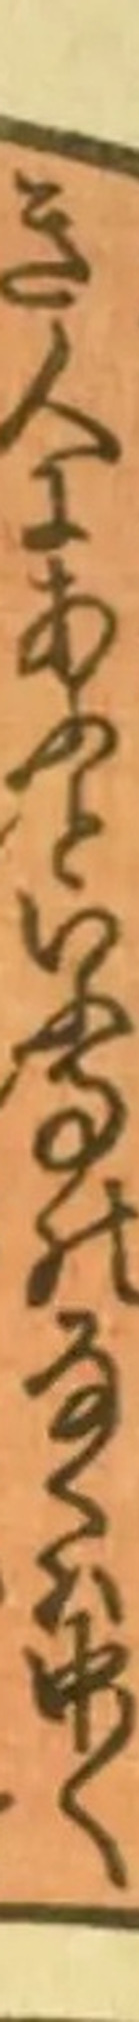き人にあふといふ事のなくは中〳〵
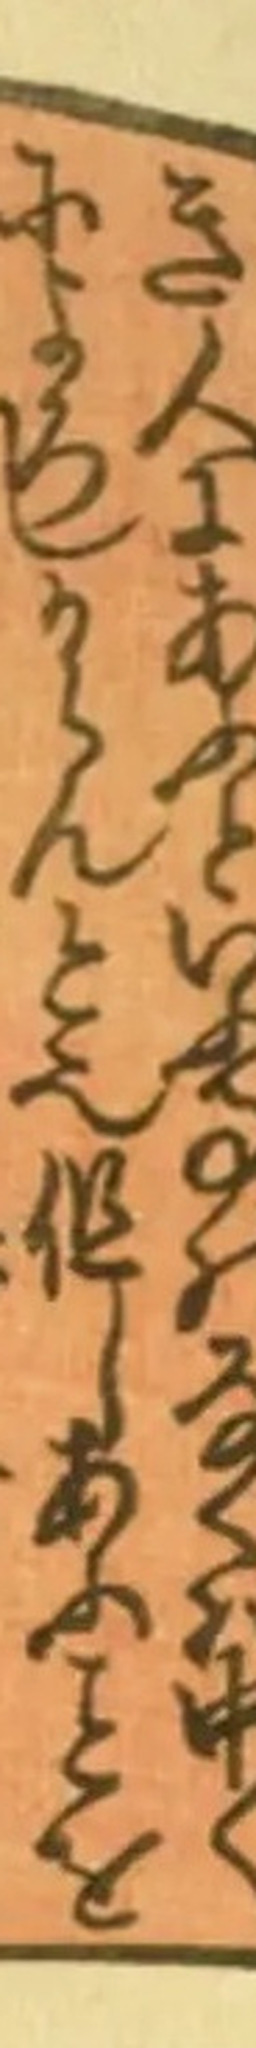によろしからんと也但しあふことを
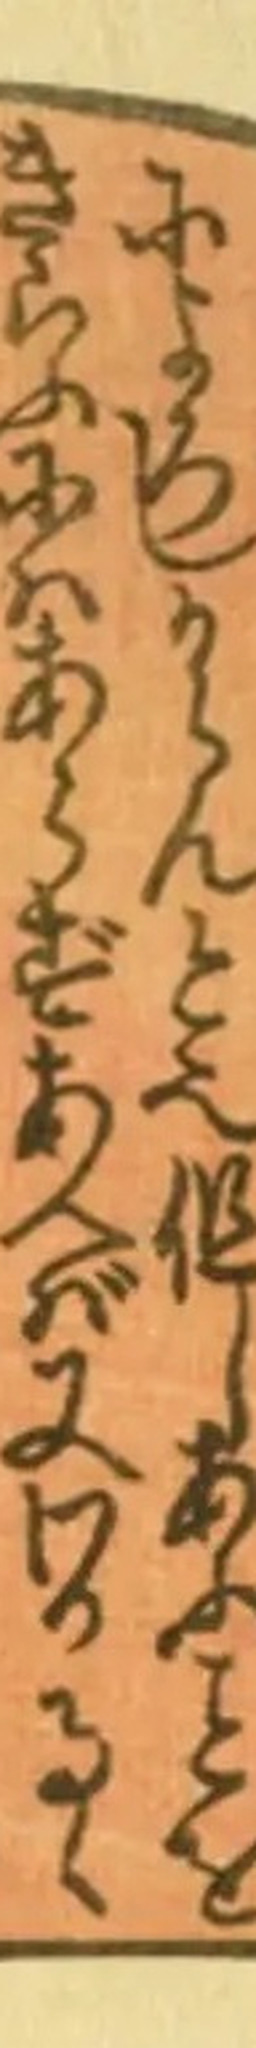きらふにはあらずあへば又わかるゝ
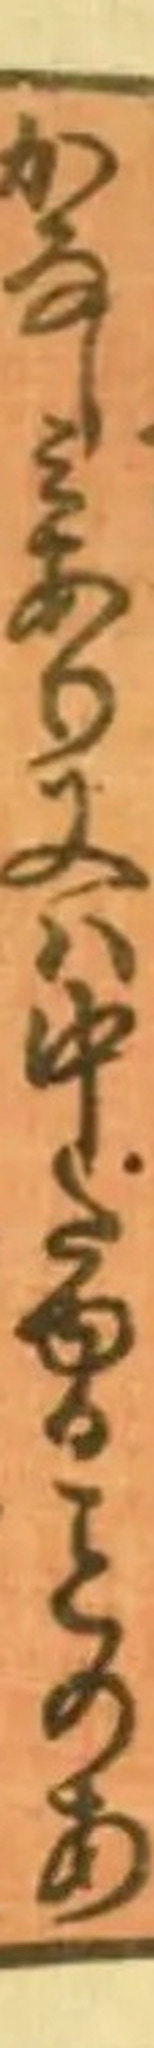かなしみあり又は中たゆることのあ
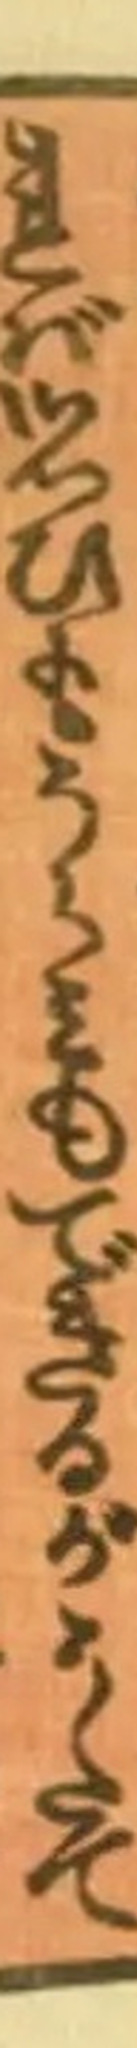れば思ひもうらみもできるがうたて
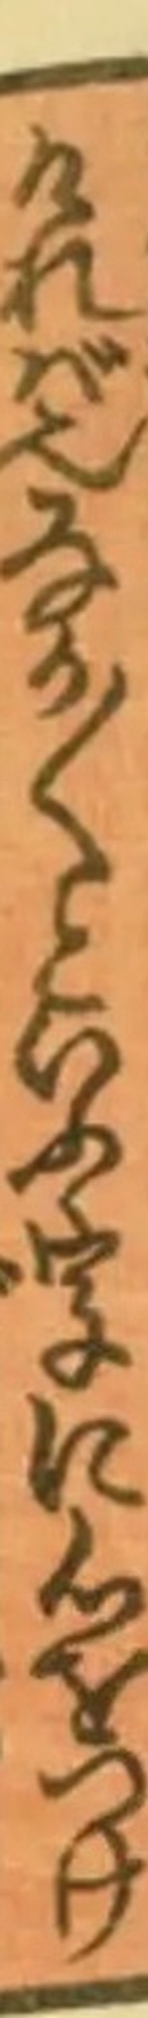ければ也なか〳〵といふ字に心をつけ
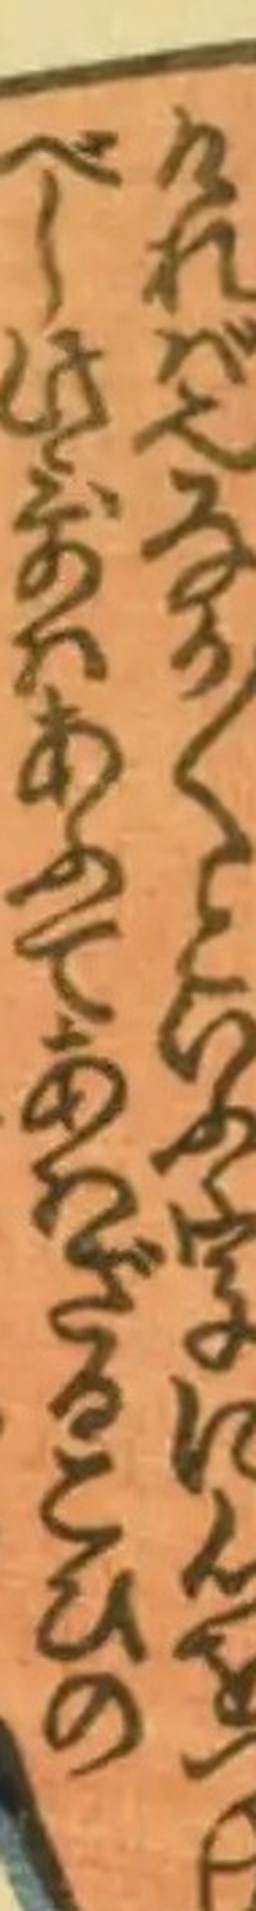べし此歌はあふてあはざるこひの
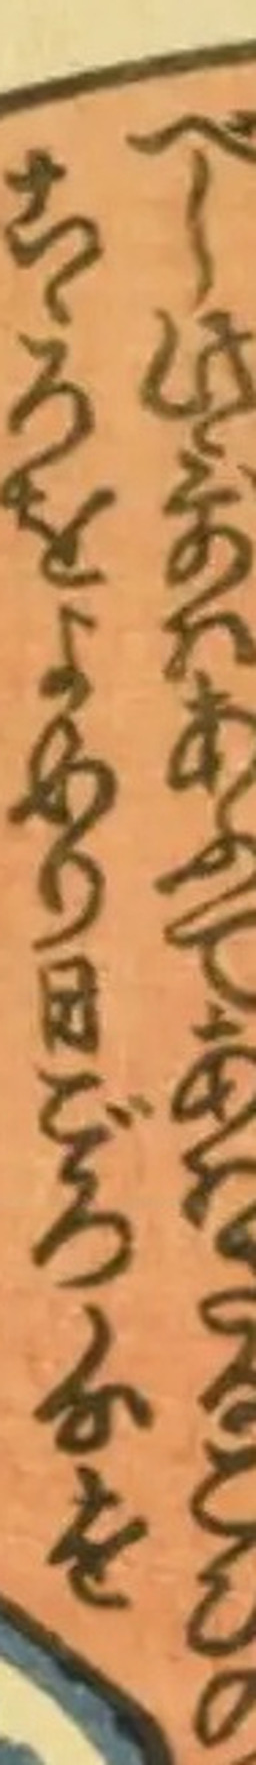こゝろをよめり日ごろ心を
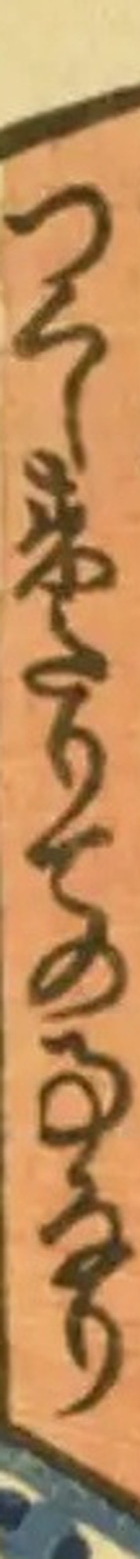つくし来たりての事なり
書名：四十四ばん　中納言朝忠
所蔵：国立国会図書館 National Diet Library, JAPAN
